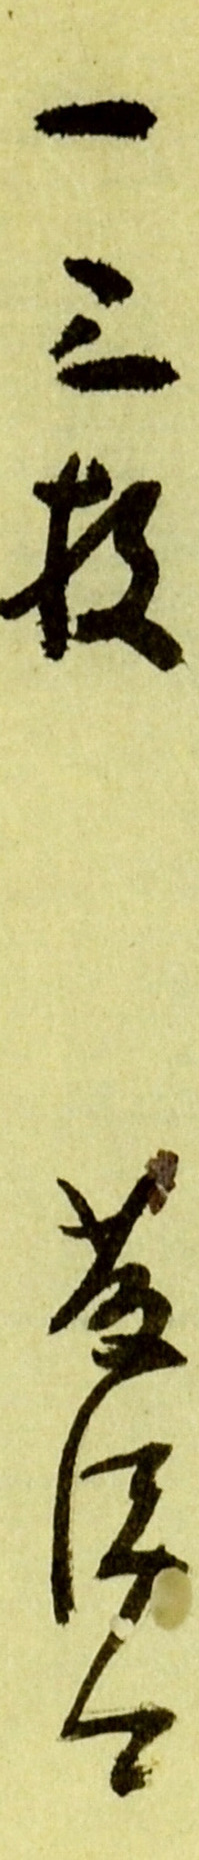一三枚藤沢郷
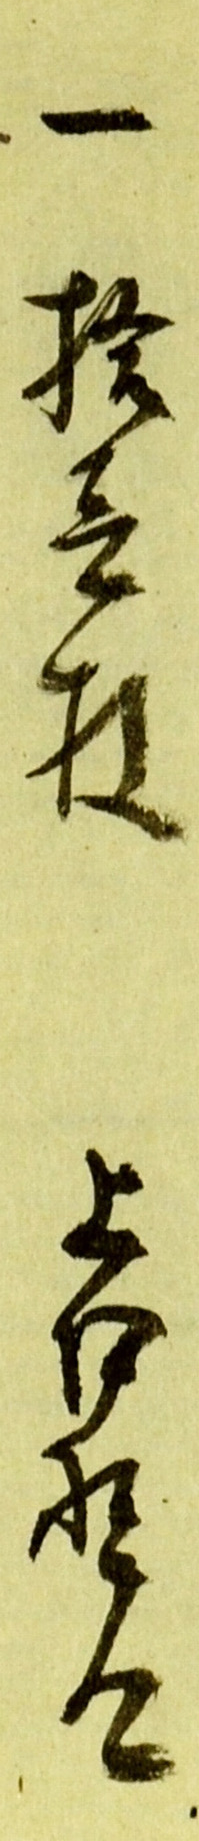一拾壱枚上伊那郷
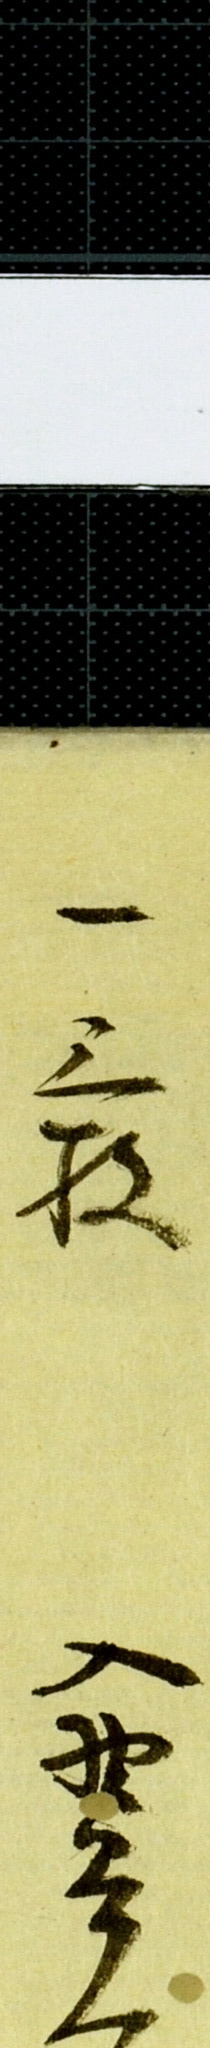一三枚入野谷郷
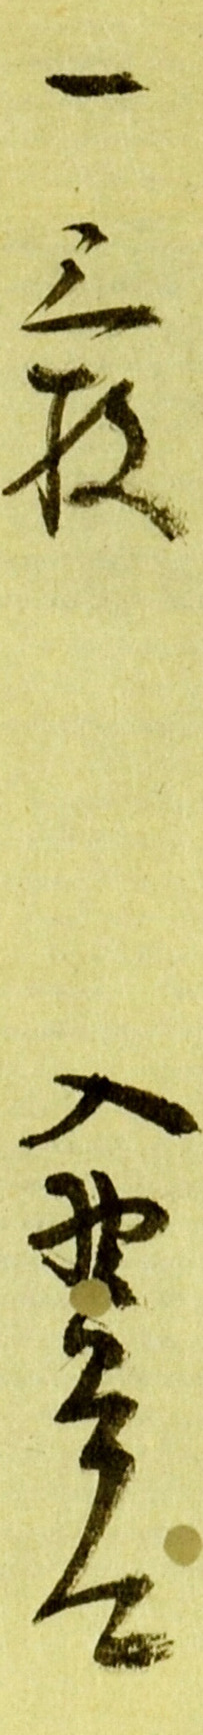一三枚入野谷郷
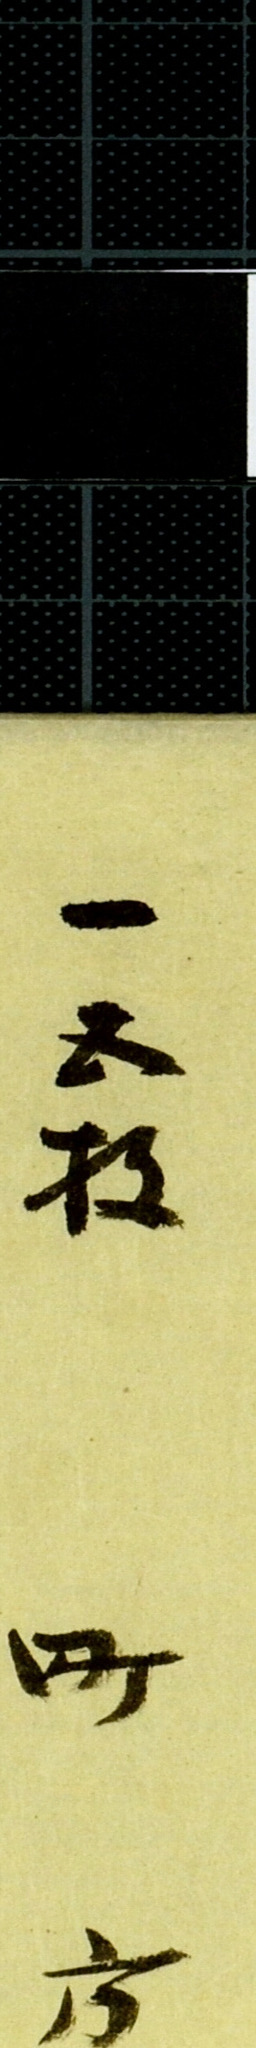一五枚町方
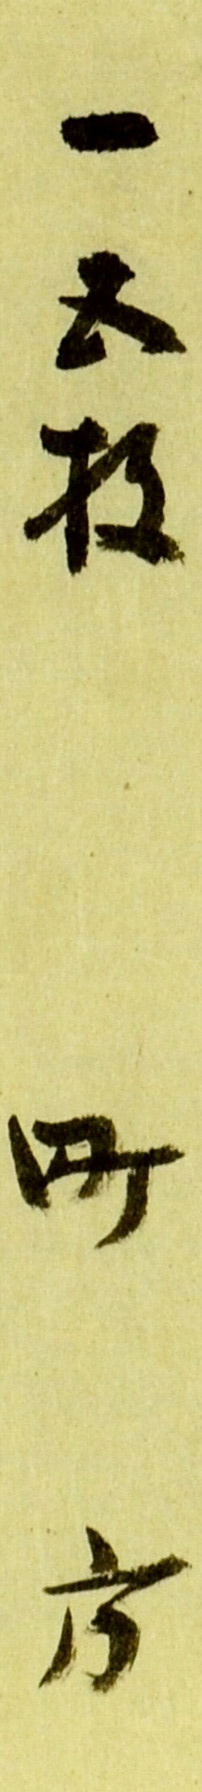一五枚町方
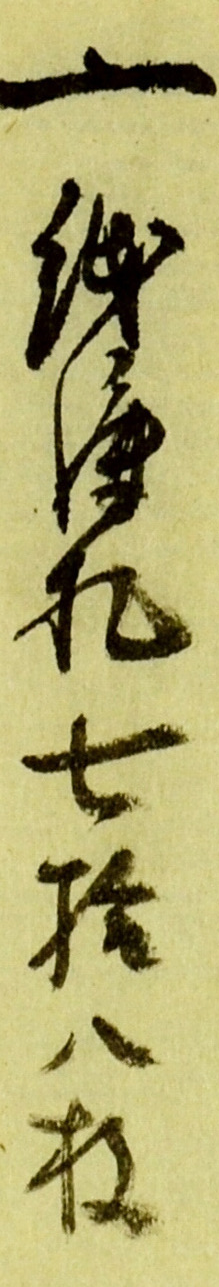〆紙漉札七拾八枚
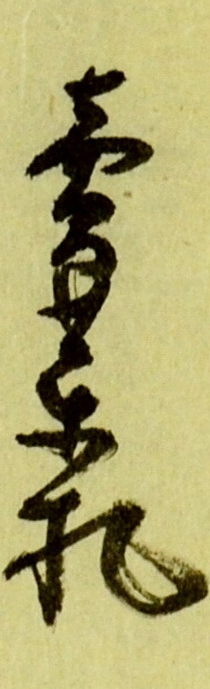売薬札
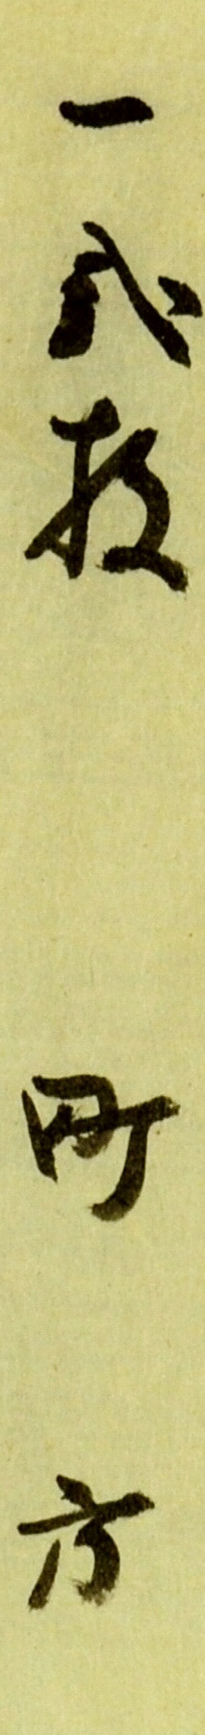一弐枚町方

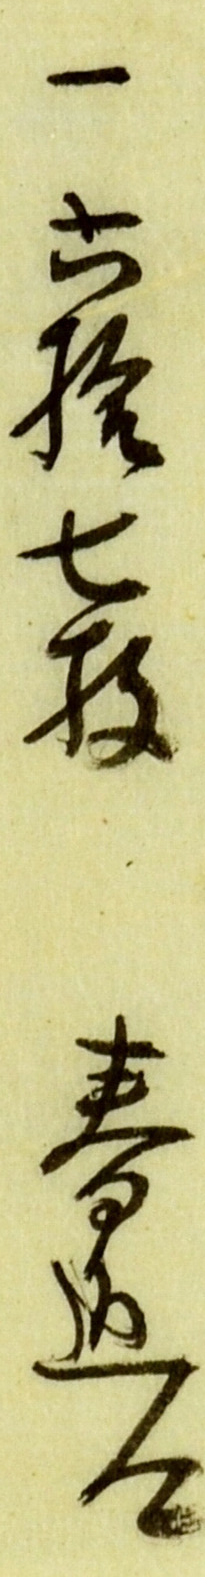一六拾七枚春近郷
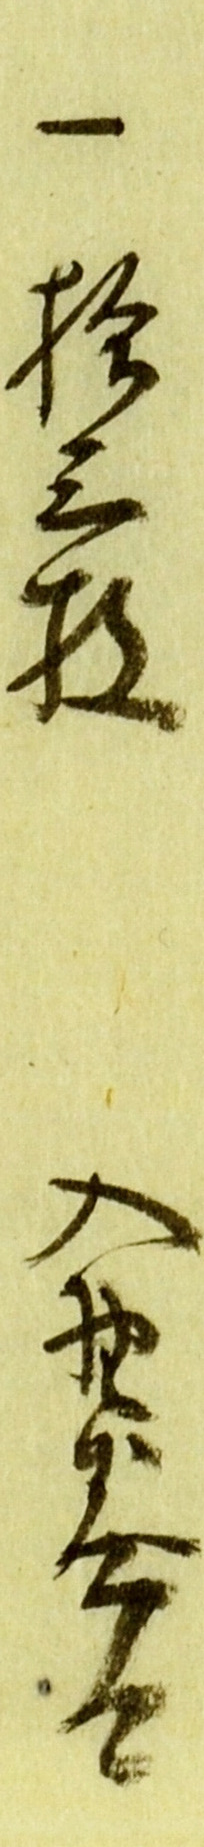一拾三枚入野谷郷
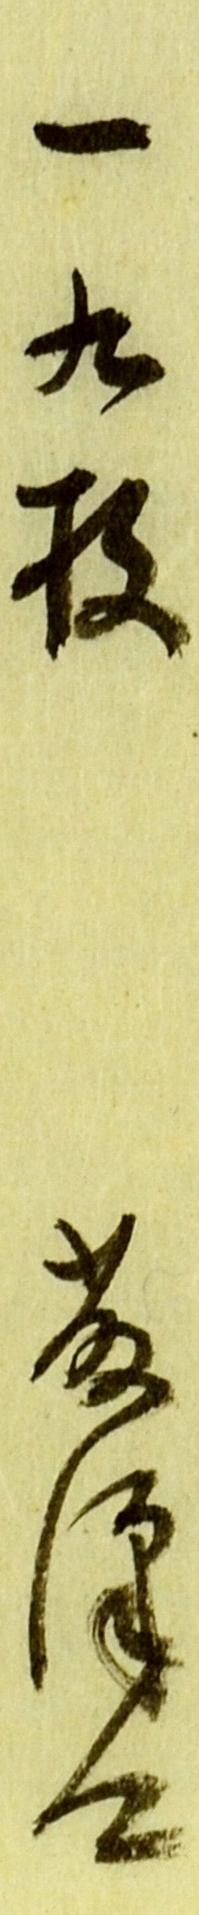一九枚藤沢郷
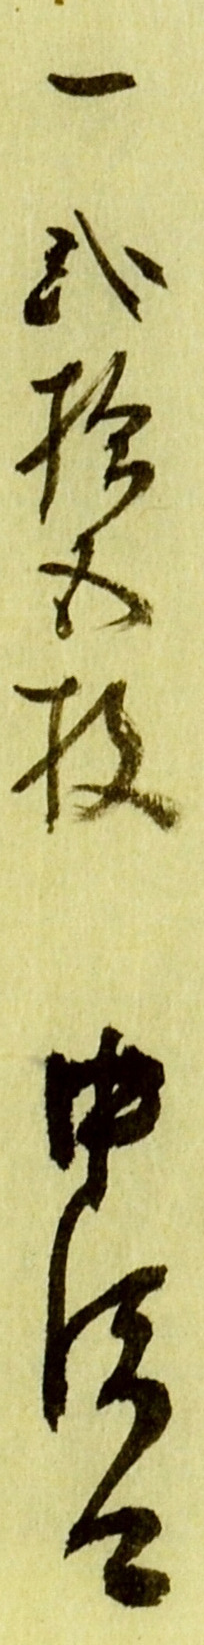一弐拾五枚中沢郷
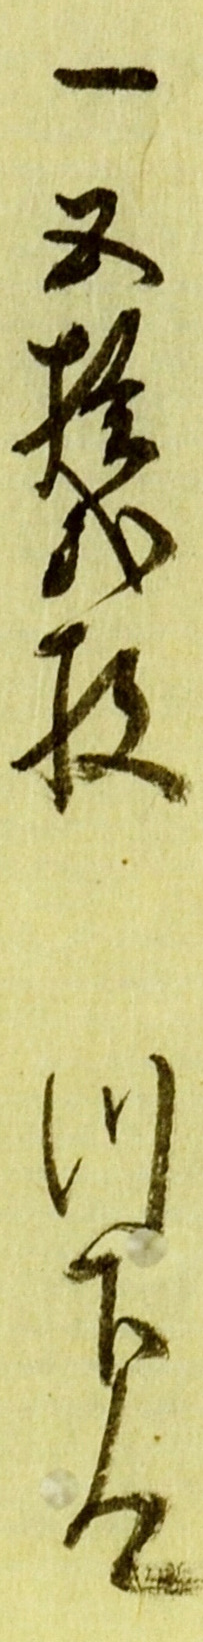一五拾弐枚川下郷
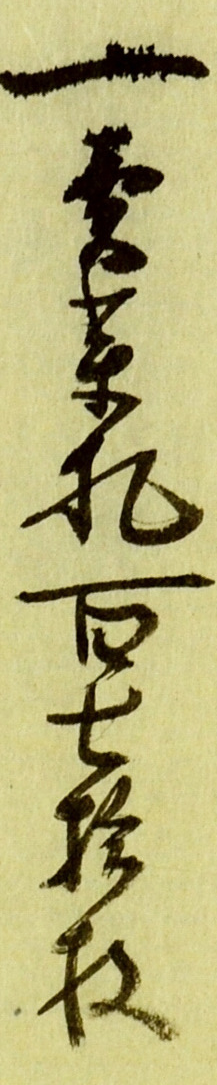〆売薬札百七拾枚
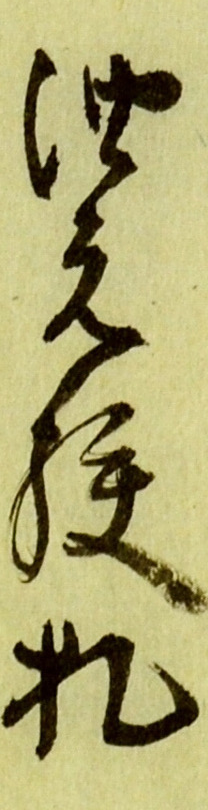油元絞札
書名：午年諸郷并町方鑑札渡覚
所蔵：伊那市立高遠町図書館・合同会社AMANE
